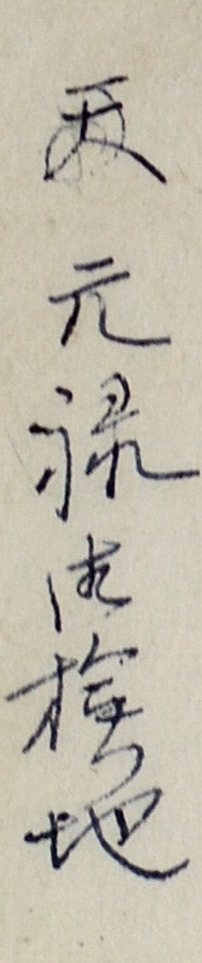天元禄御検地
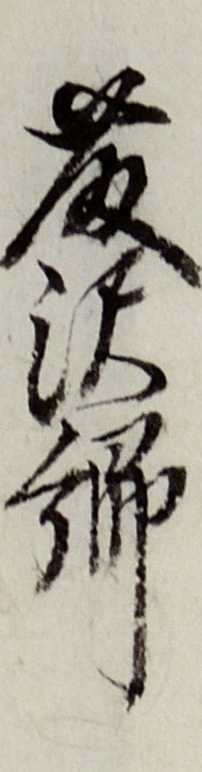藤沢郷
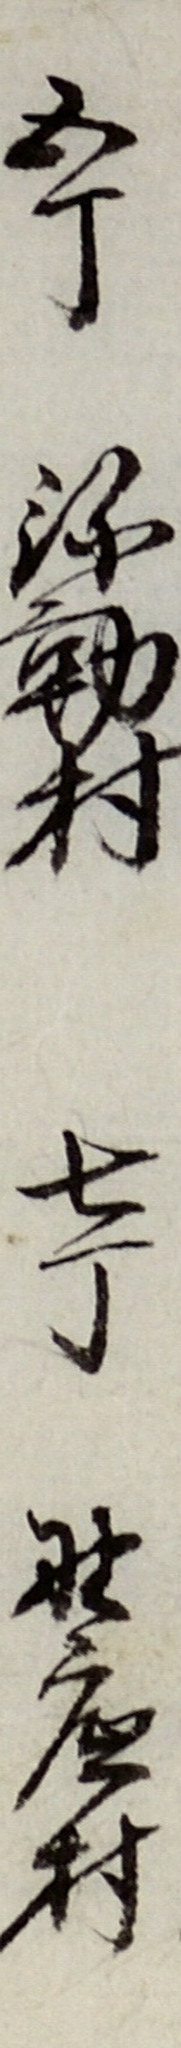五丁弥勒村七丁野底村
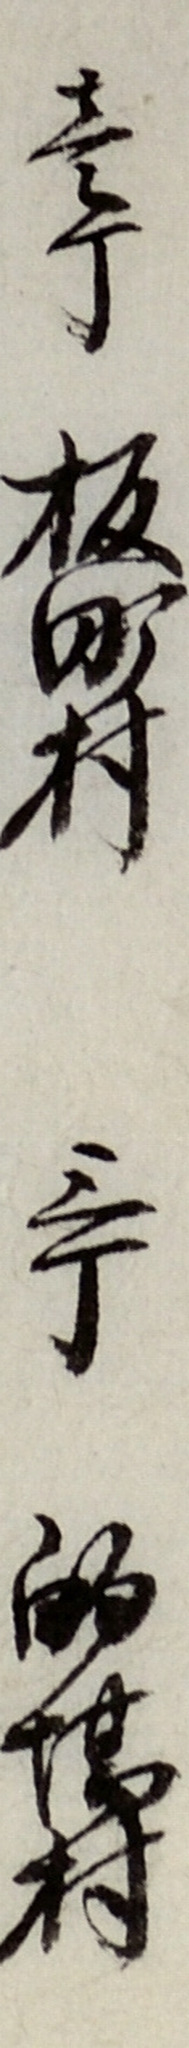壱丁板町村三丁的場村
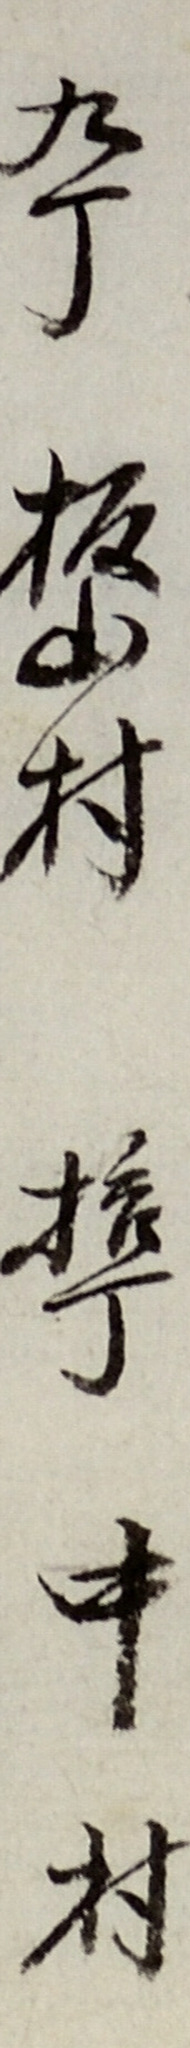九丁板山村拾丁中村
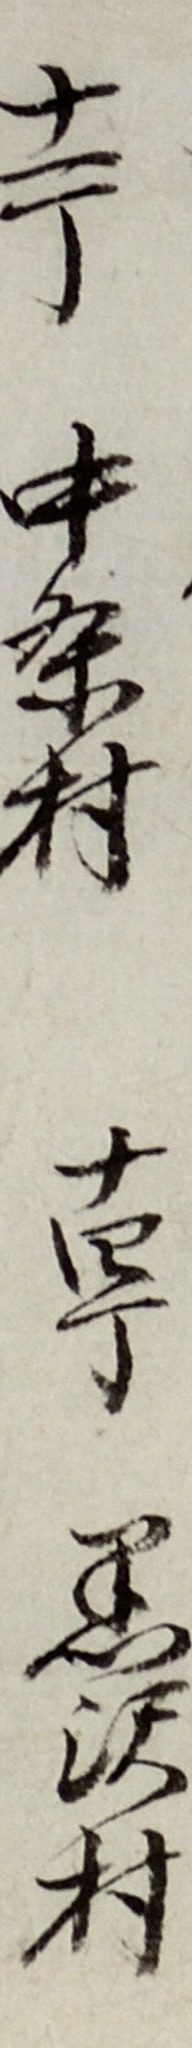十一丁中条村十四丁黒沢村
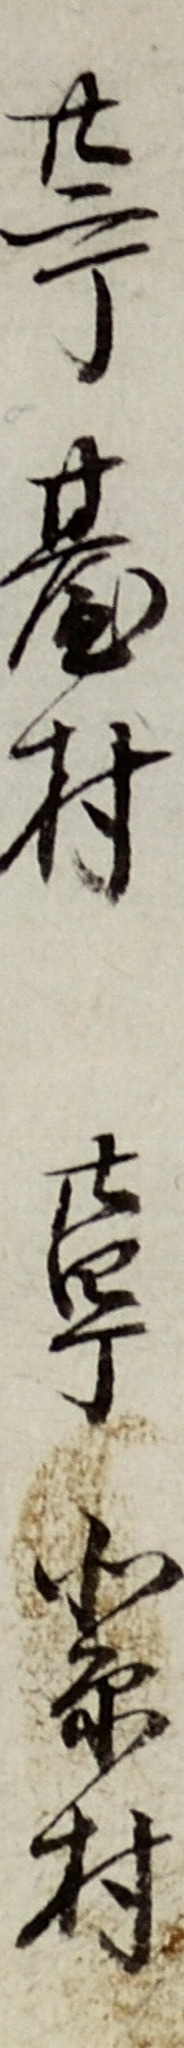廿二丁台村廿四丁北原村
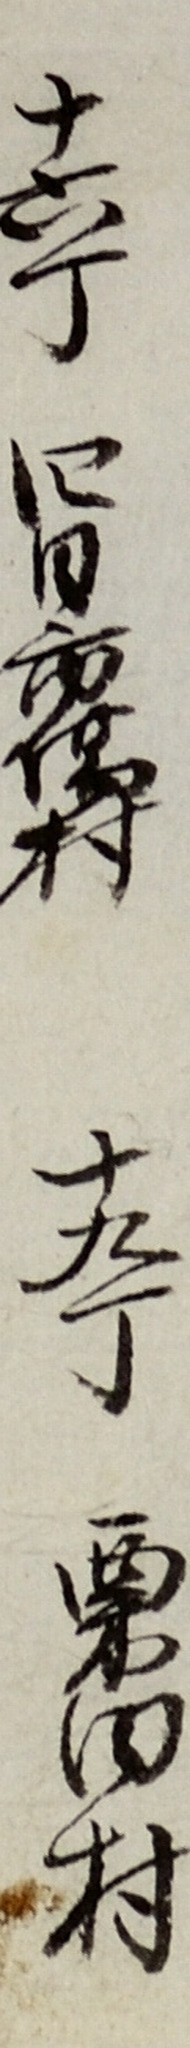十六丁四日市場村十九丁栗田村
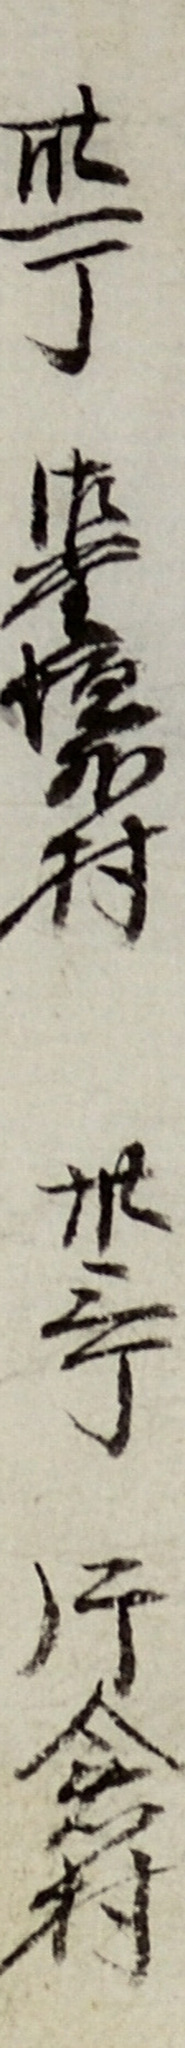丗一丁御堂垣外村丗三丁片倉村
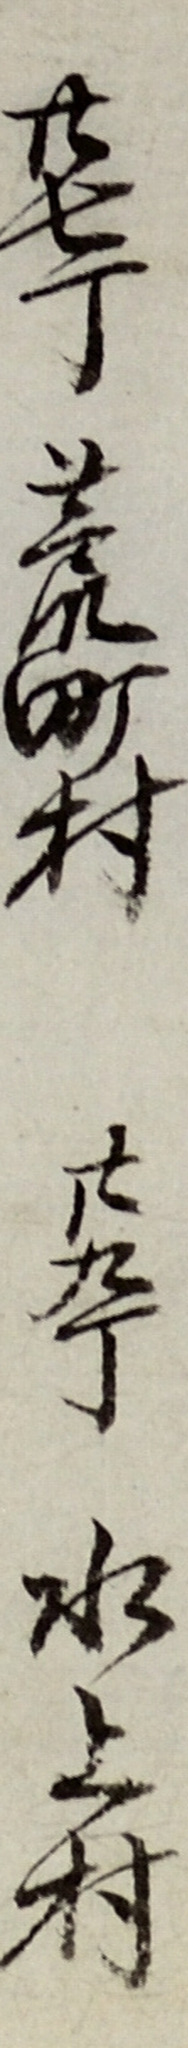廿七丁荒町村廿九丁水上村

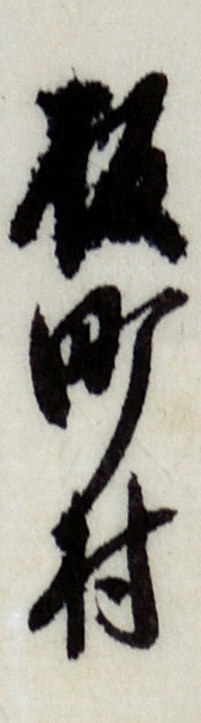板町村
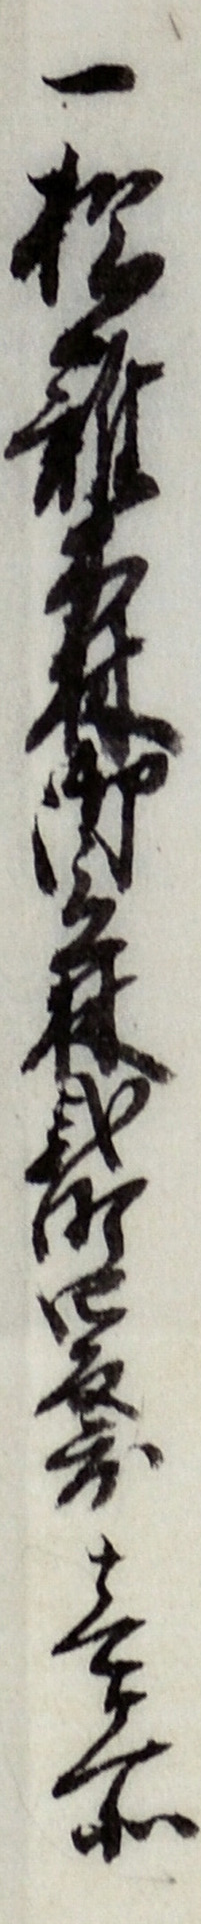一松雑木林御立林弐町四反歩壱ケ所
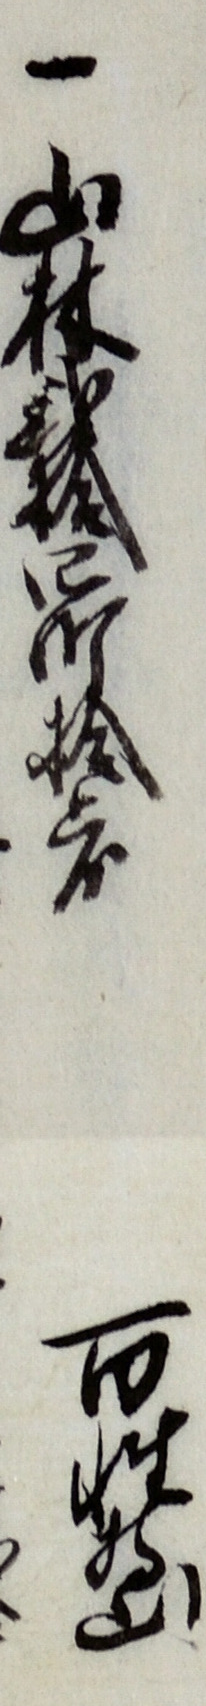一山林弐拾四町拾歩百姓持山
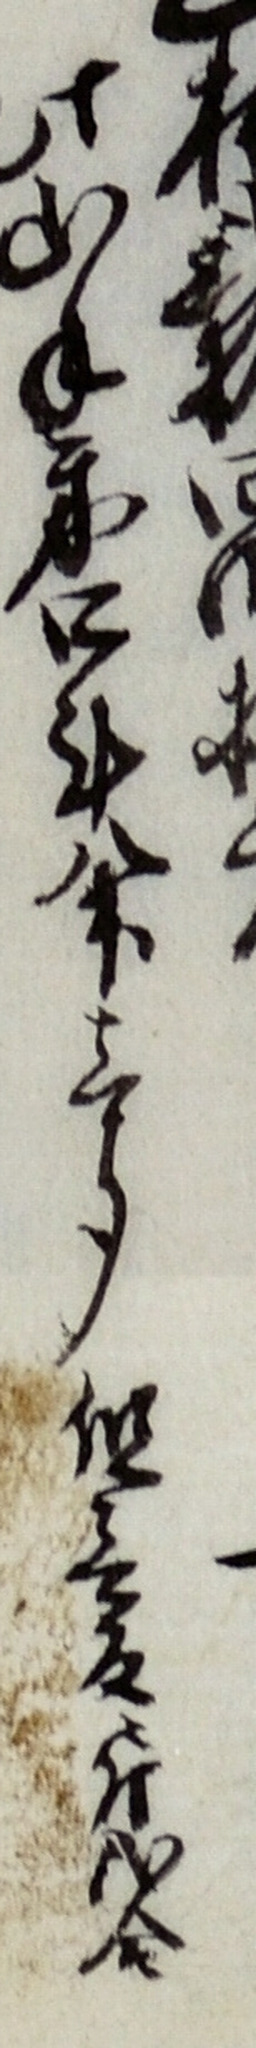此山手米四斗八升壱勺但壱反ニ付弐合
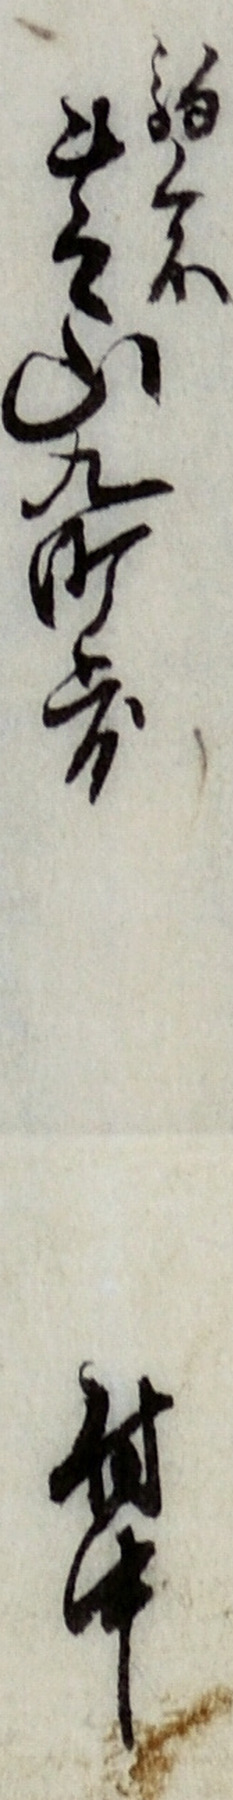青山九町歩村中
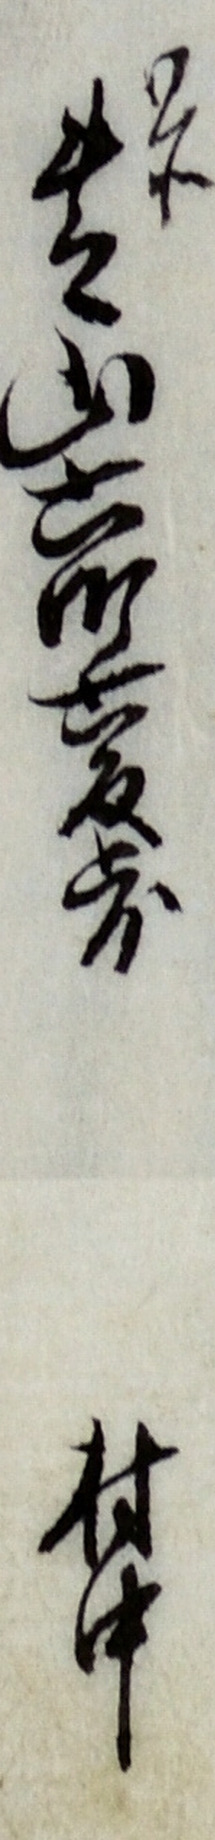芝山六町六反歩村中
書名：御領分中山林社地手控
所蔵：伊那市立高遠町図書館・合同会社AMANE
